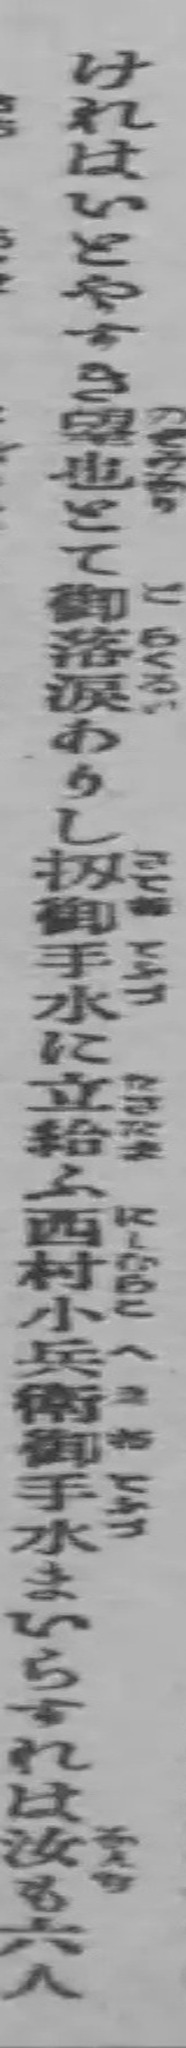けれはいとやすき望也とて御落涙ありし扨御手水に立給ふ西村小兵衛御手水まいらすれは汝も六人
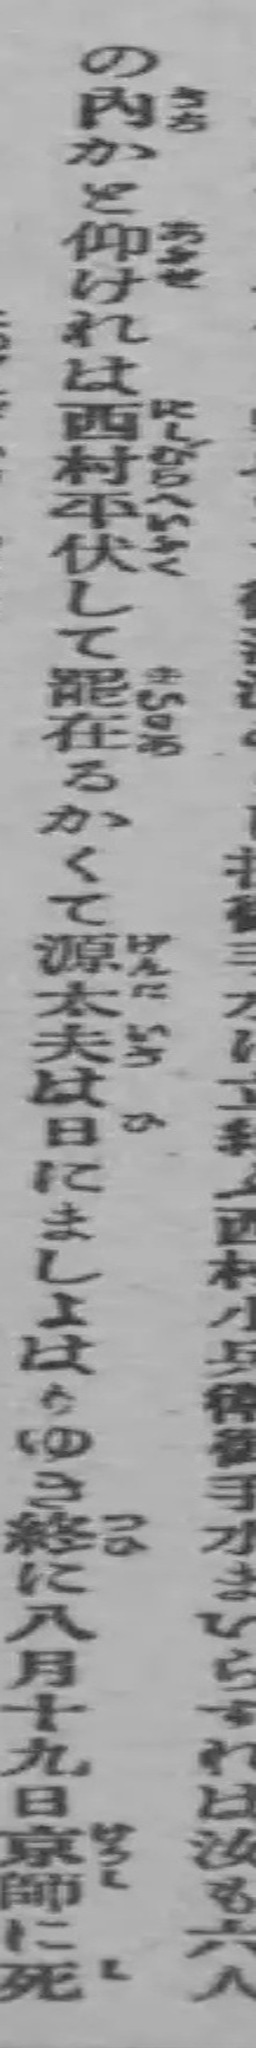の内かと仰けれは西村平伏して罷在るかくて源太夫は日にましよはりゆき終に八月十九日京師に死
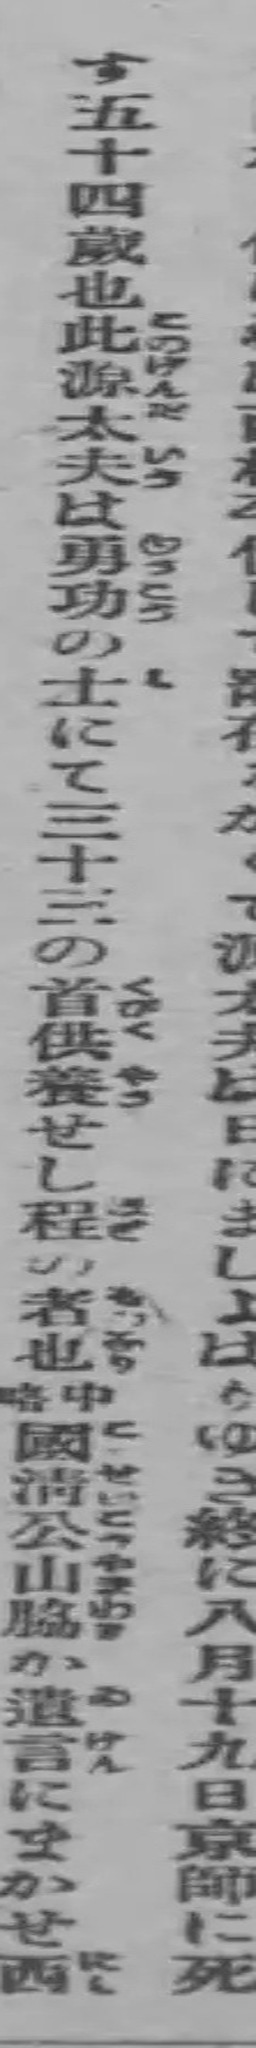す五十四歳也此源太夫は雄功の士にて三十三の首供養せし程の者也中略国清公山脇か遺言にまかせ西
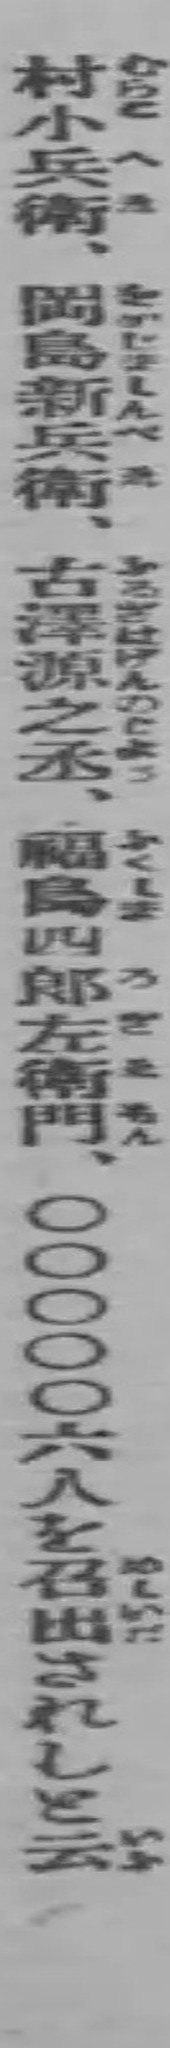村小兵衛、岡島新兵衛、古澤源之丞、福島四郎左衛門、○○○○○六人を召出されしと云
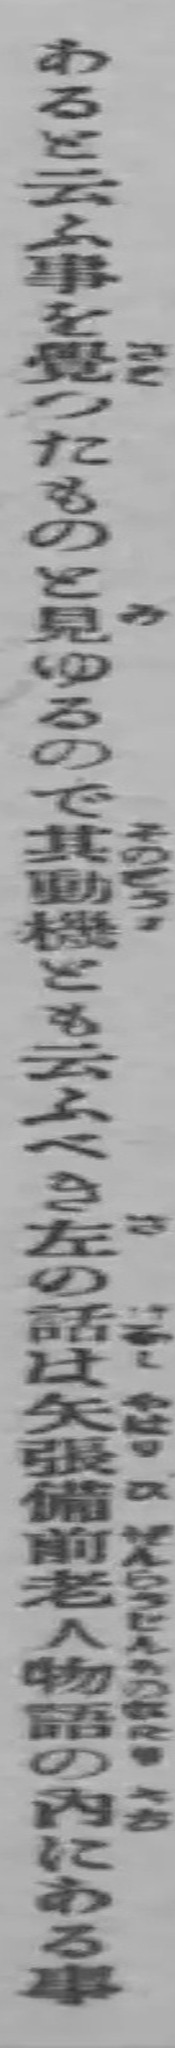あると云ふ事を覚つたものと見ゆるので其動機とも云ふべき左の話は矢張備前老人物語の内にある事
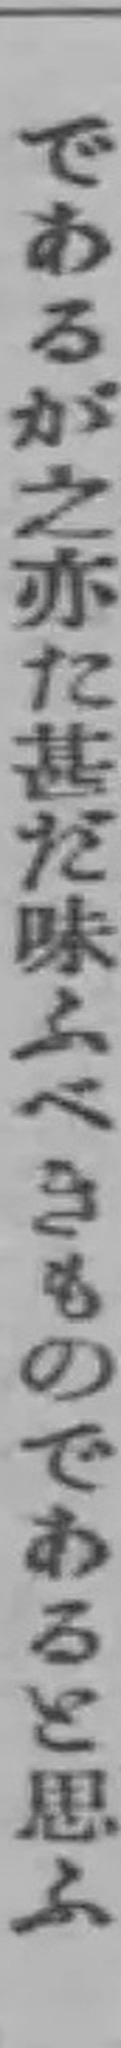であるが之亦た甚だ味ふべきものであると思ふ
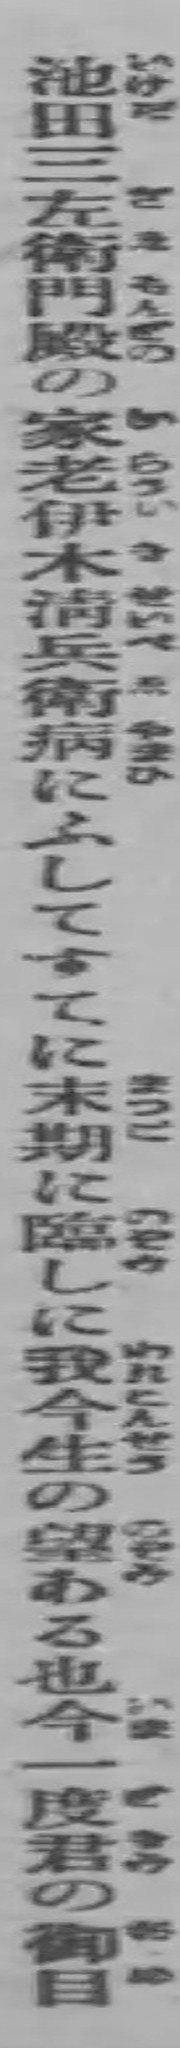池田三左衛門殿の家老伊木清兵衛病にふしてすてに末期に臨しに我今生の望ある也今一度君の御目
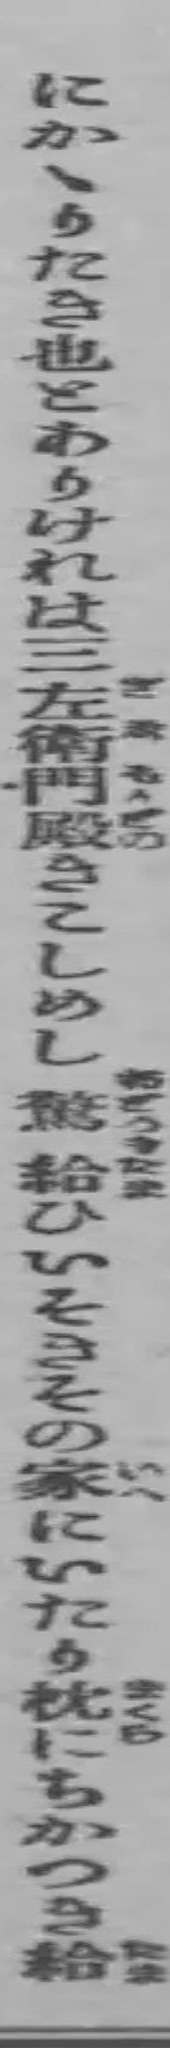にかゝりたき也とありけれは三左衛門殿きこしめし驚給ひいそきその家にいたり枕にちかつき給
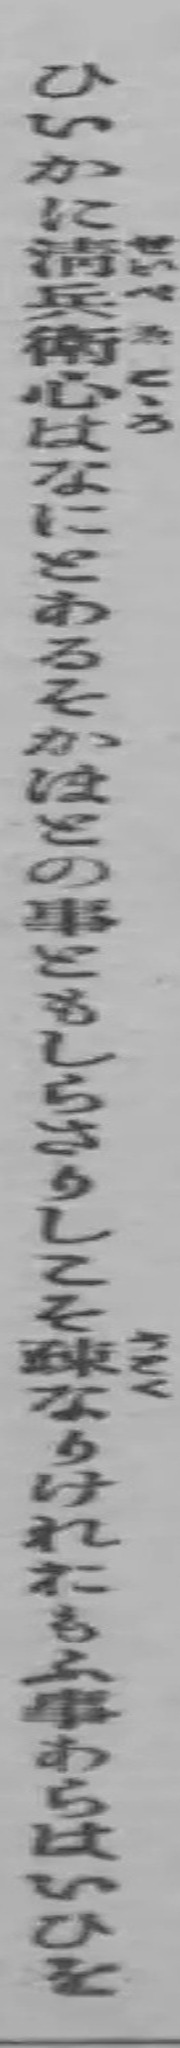ひいかに清兵衛心はなにとあるそかほとの事ともしらさりしこそ疎なりけれおもふ事あらはいひを
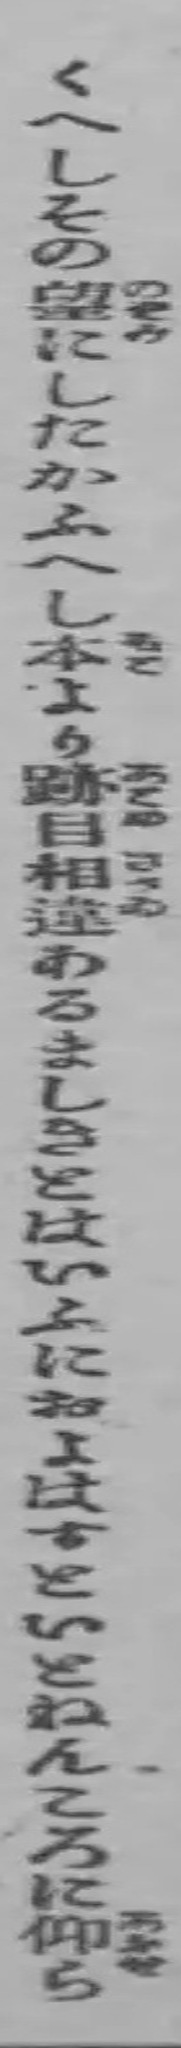くへしその望にしたかふへし本より跡目相違あるましきとはいふにおよはすといとねんころに仰ら
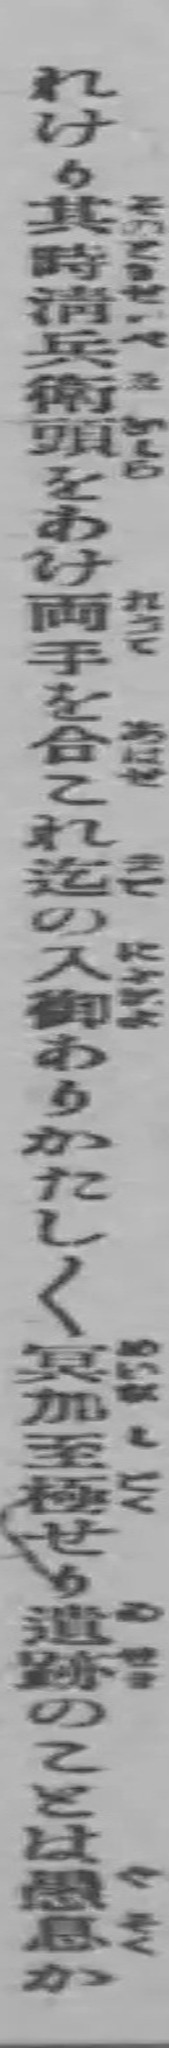れけり其時清兵衛頭をあけ両手を合これ迄の入御ありかたし〳〵冥加至極せり遺跡のことは愚息か
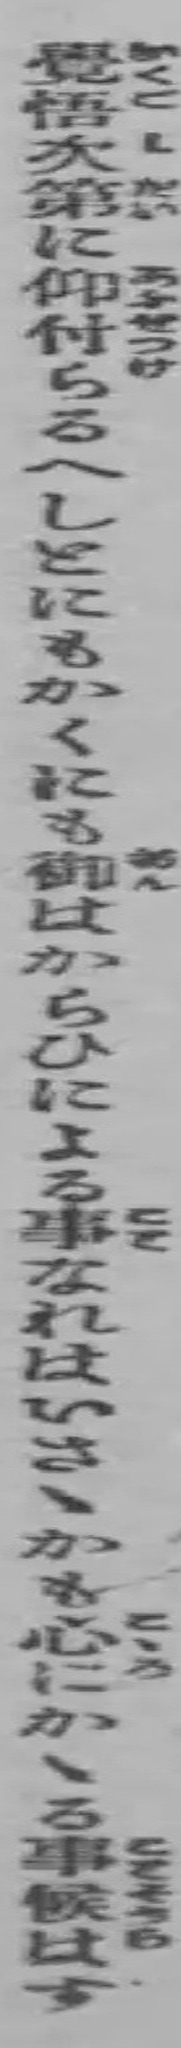覚悟次第に仰付らるへしとにもかくにも御はからひによる事なれはいさゝかも心にかゝる事候はす
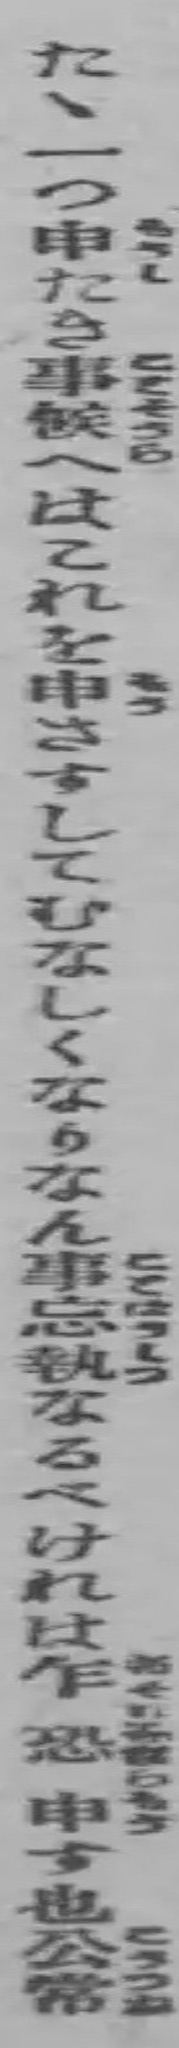たゝ一つ申たき事候へはこれを申さすしてむなしくなりなん事忘執なるべけれは乍恐申す也公常
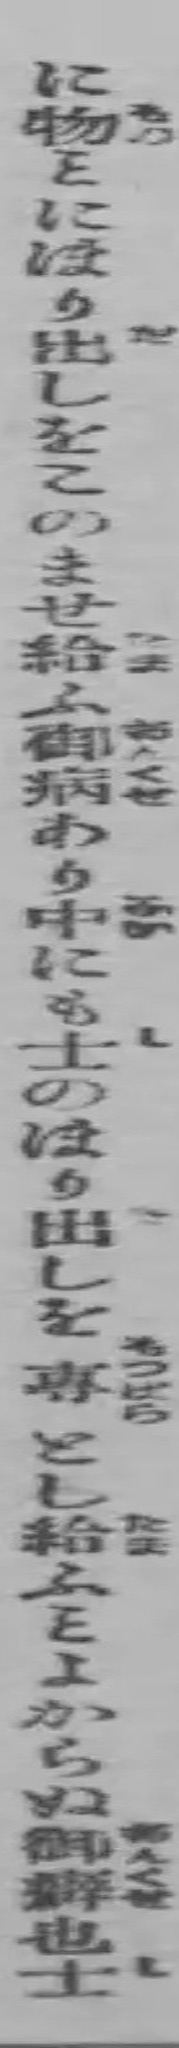に物ことにほり出しをこのませ給ふ御病あり中にも士のほり出しを専とし給ふことよからぬ御病也士
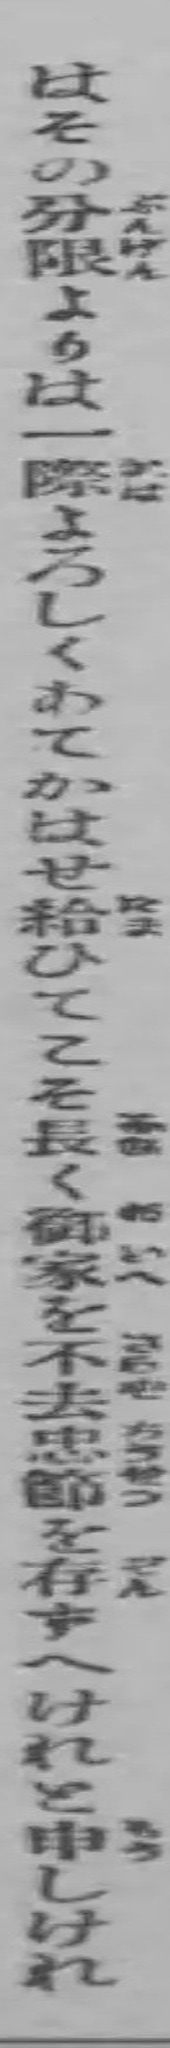はその分限よりは一際よろしくあてかはせ給ひてこそ長く御家を不去忠節を存ずへけれと申しけれ
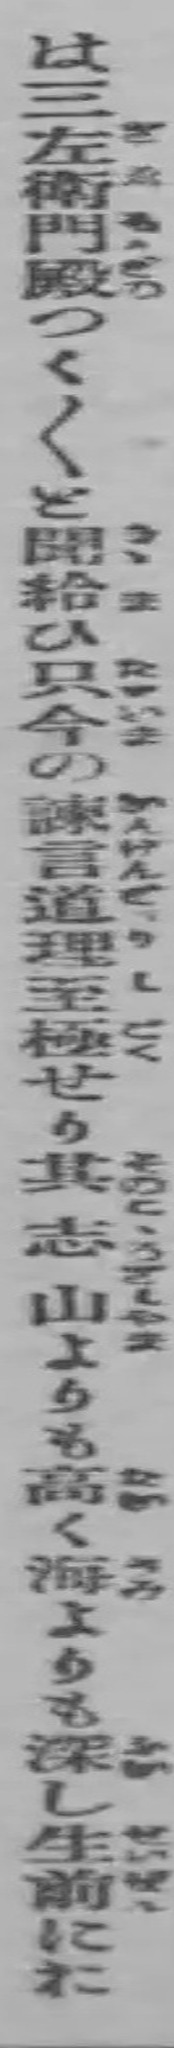は三左衛門殿つく〳〵と聞給ひ只今の諫言道理至極せり其志山よりも高く海よりも深し生前にお
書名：豊橋市史談
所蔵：国立国会図書館 National Diet Library, JAPAN
